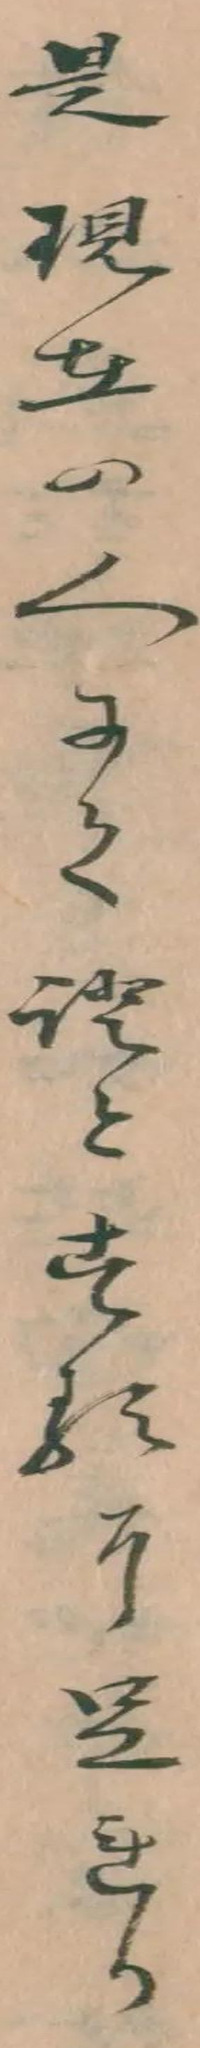是現在の人にて證とするに足れり
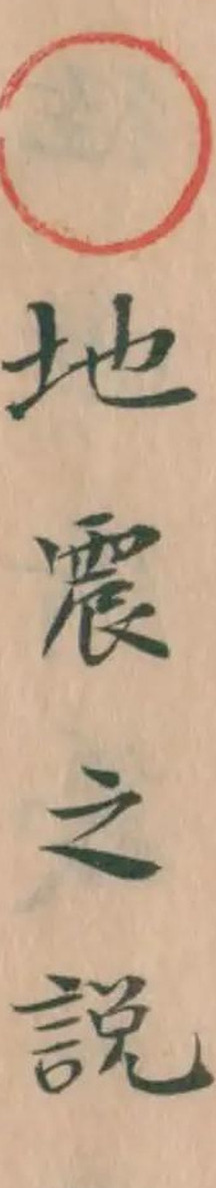〇地震の説

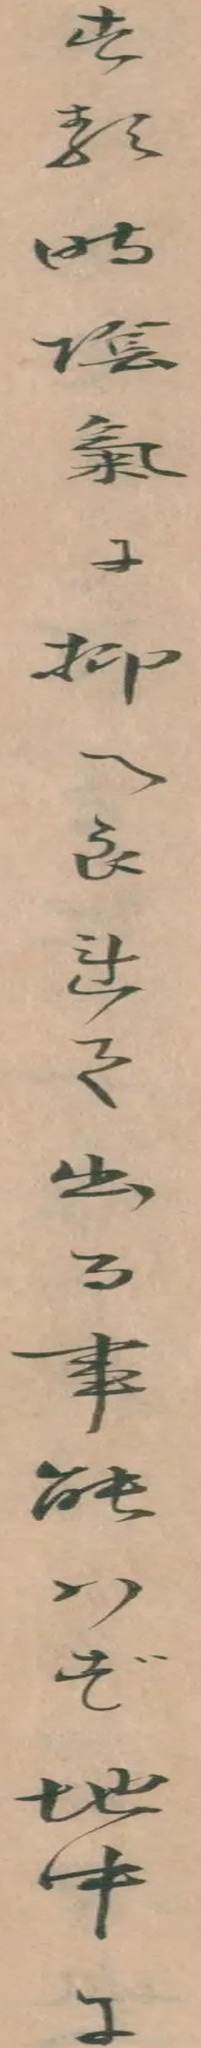する時陰気に抑へられて出る事能はず地中に
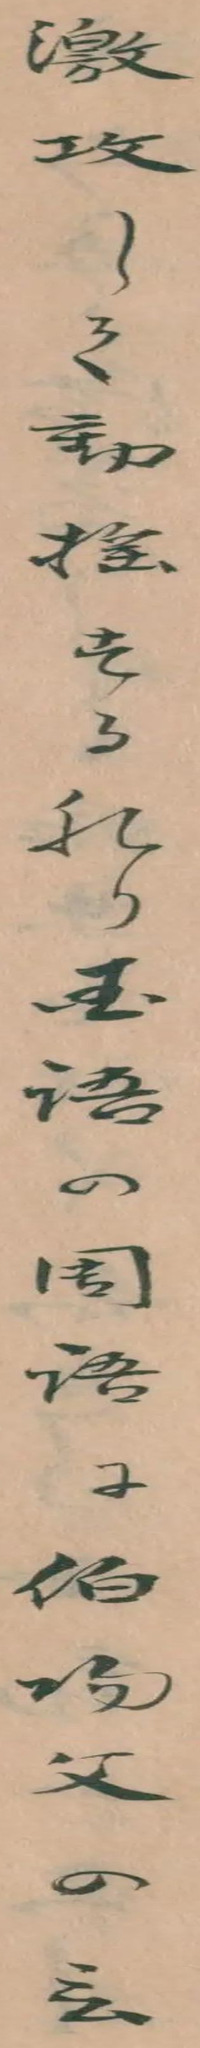激攻して動揺するなり国語の周語に伯湯父の言
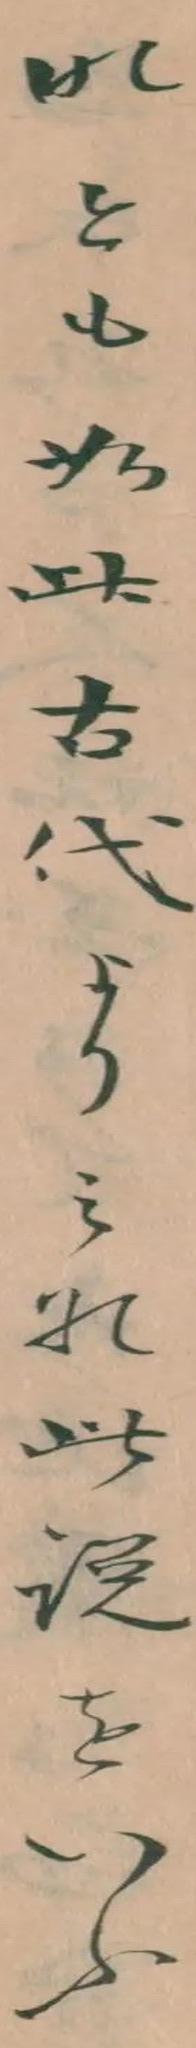なとも如此古代よりみな此説をいふ
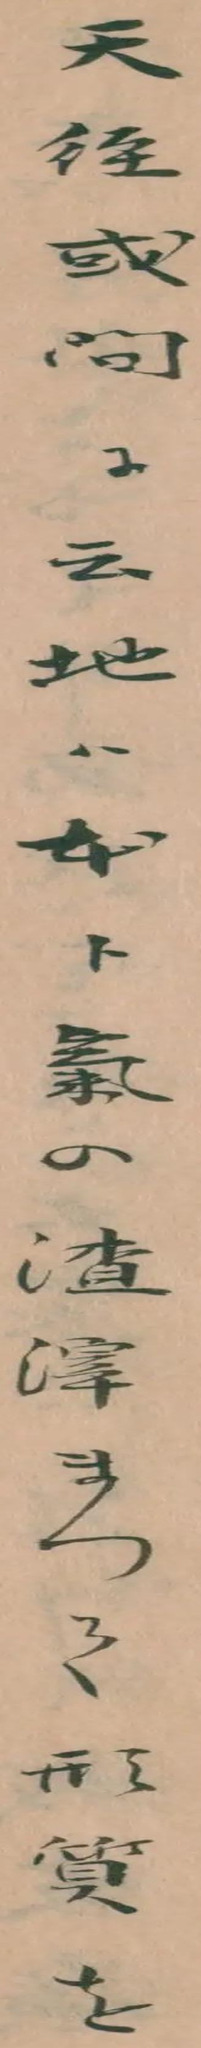天径或問に云地は本卜気の渣滓まつて形質を
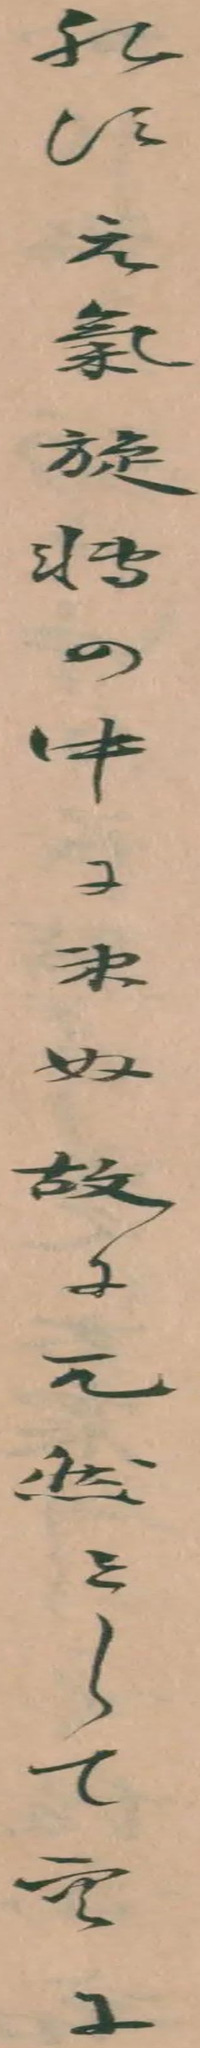なす元気旋転の中に束ぬ故に兀然として空に
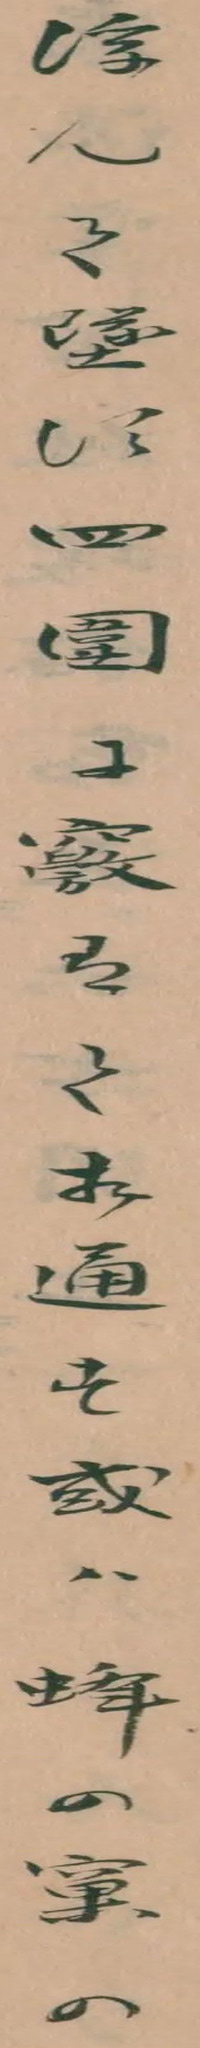浮んて墜す四囲に竅有て相通す或は蜂の窠の
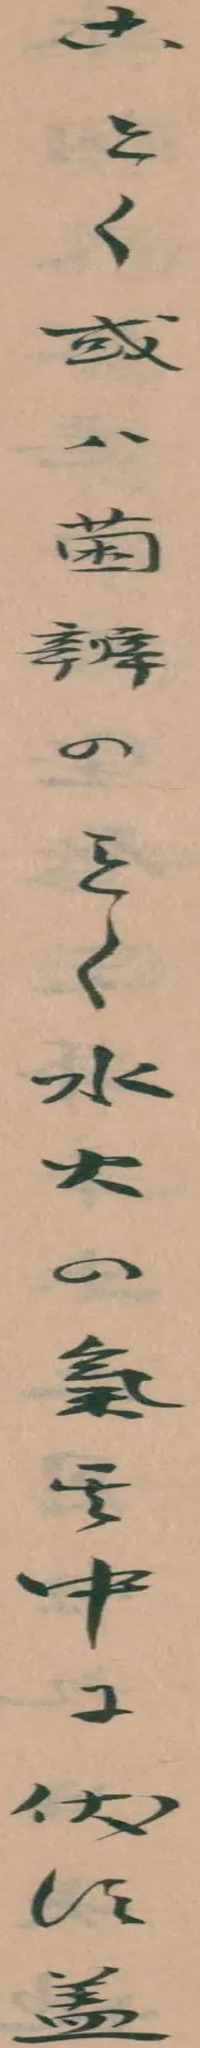ことく或は菌？弁のことく水火の気其中に伏す蓋
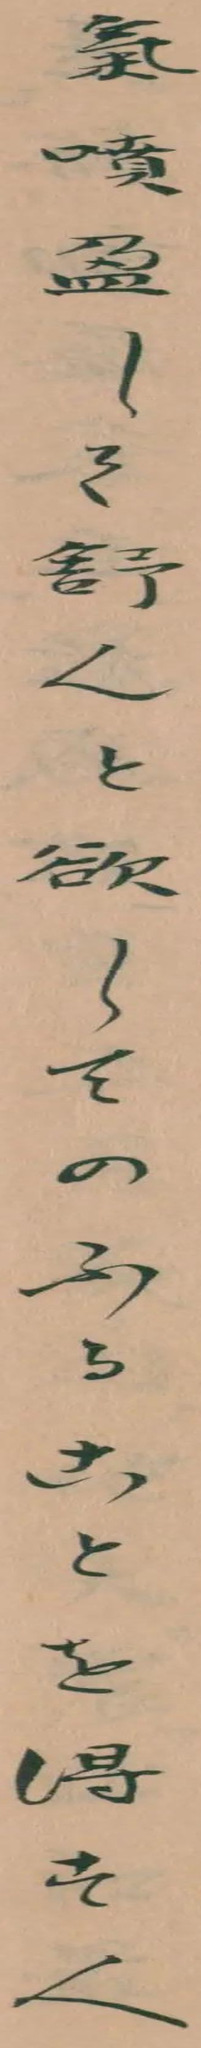気噴盈して舒んと欲してのふることを得す人
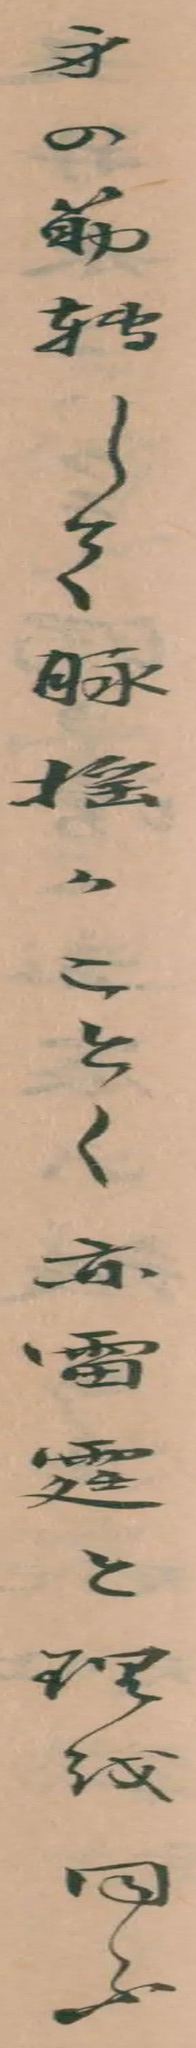身の筋転して脈揺かことく亦雷霆と理を同ふ
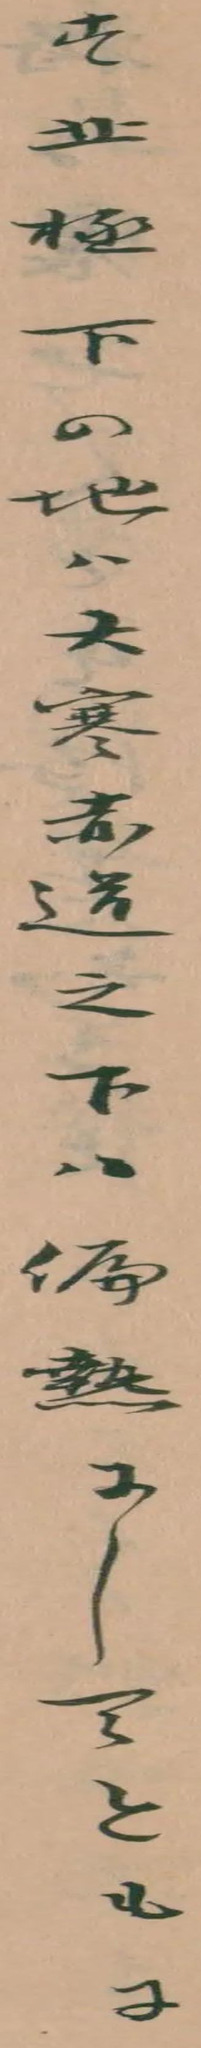す北極下の地は大寒赤道之下は偏熱にしてともに
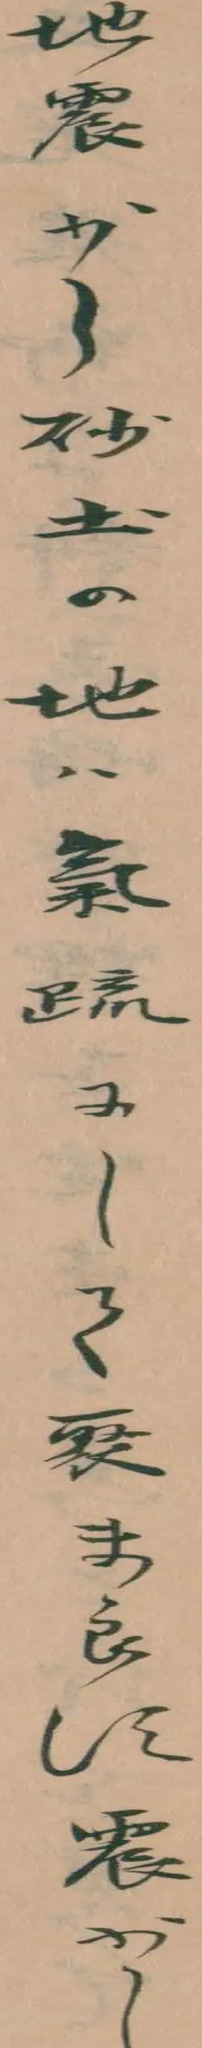地震少し砂土の地は気疏にして聚まらす震少し
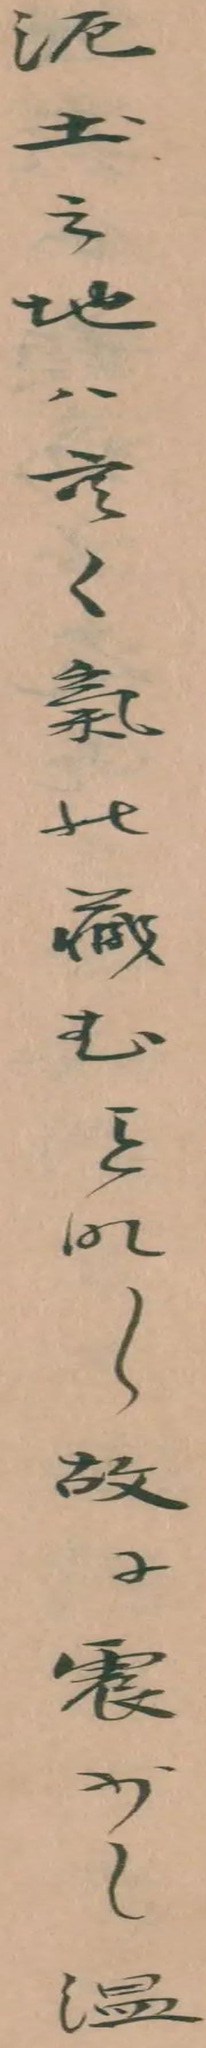泥土之地は空く気の藏むことなし故に震少し温
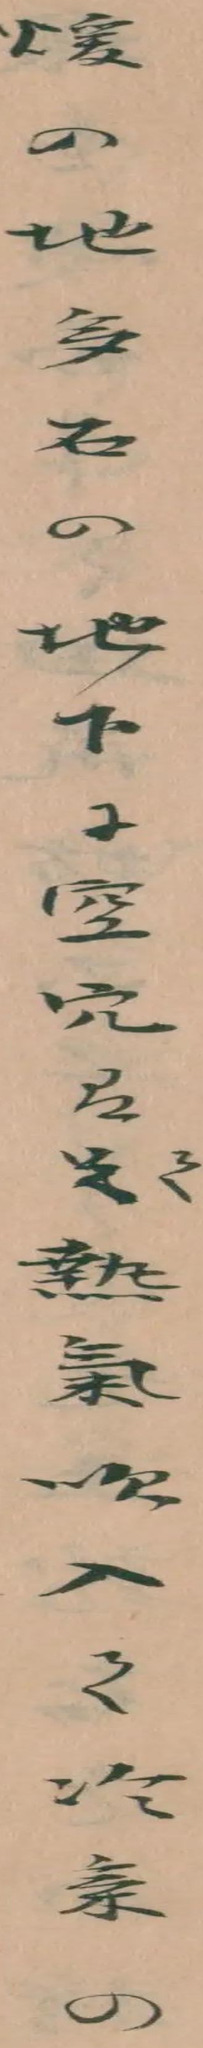煖の地多石の地下に空穴有て熱気吹入て冷気の
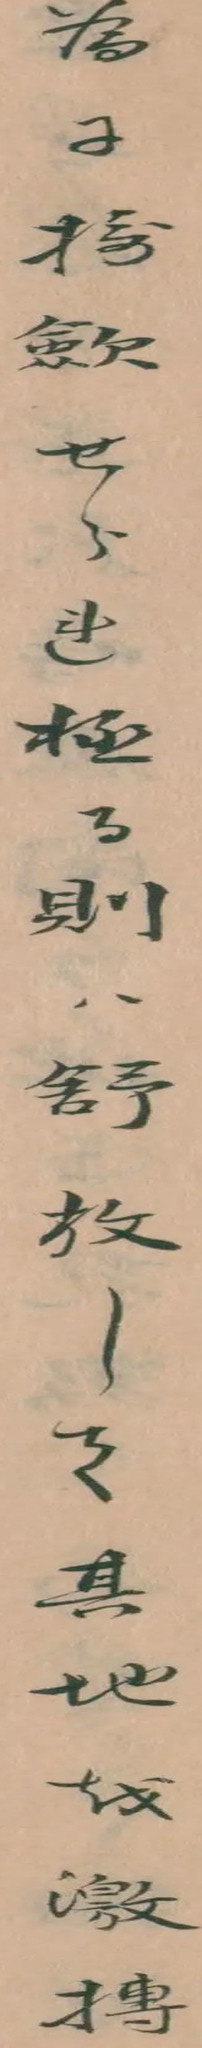為に摂斂せられ極る則は舒放して其地を激搏
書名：地災撮要. 巻5-6(地震之部)
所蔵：国立国会図書館 National Diet Library, JAPAN
